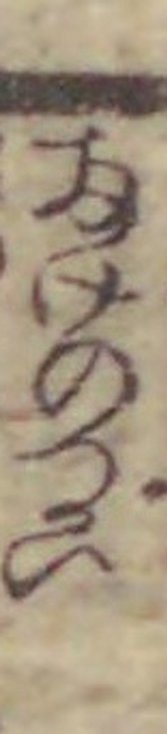両けのつかい
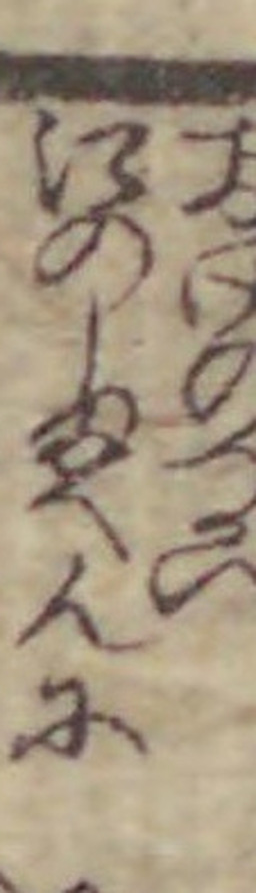江のしまへんに
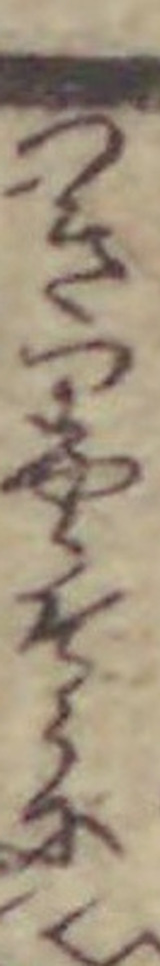つきりやうそうに
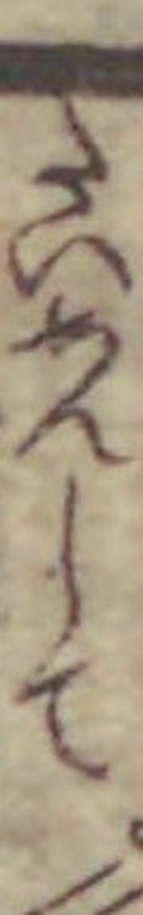たいめんして
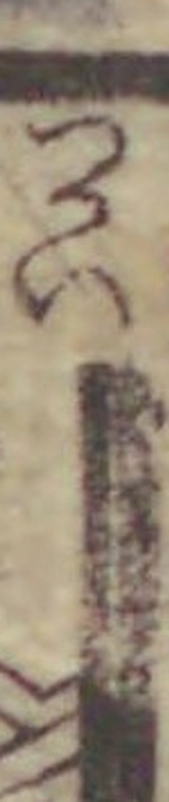つかい
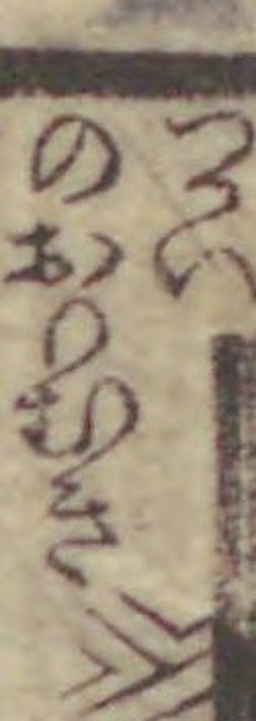のおもむき
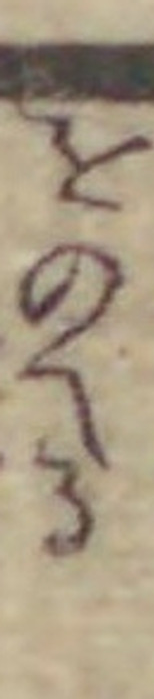をのへる
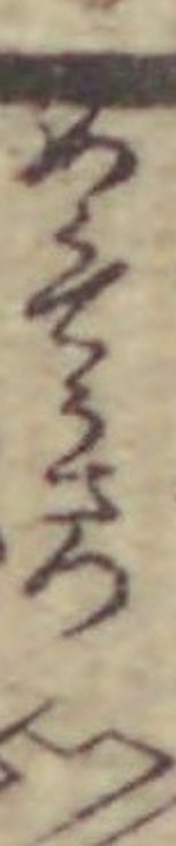めうてうさつ
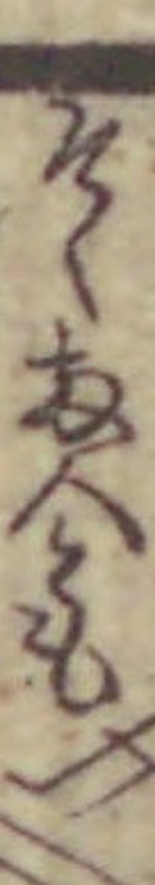そく両人とも
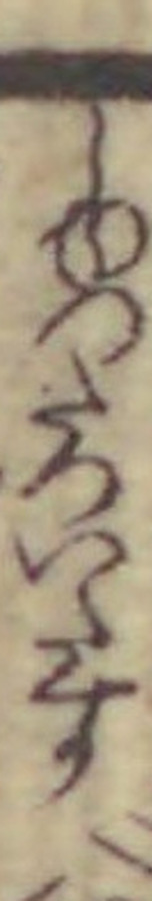しゆつたついたす
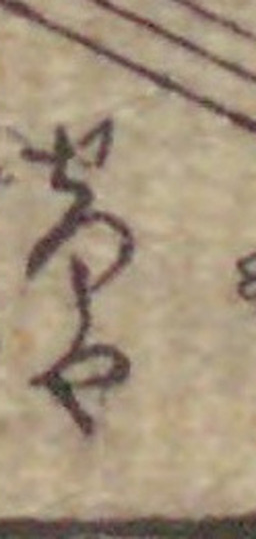せつしや
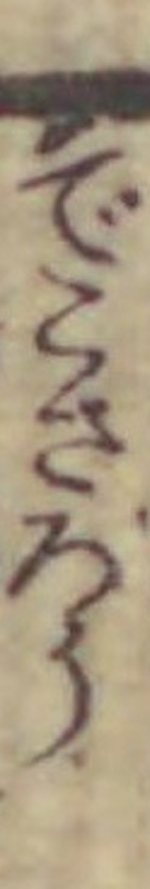でこさろう
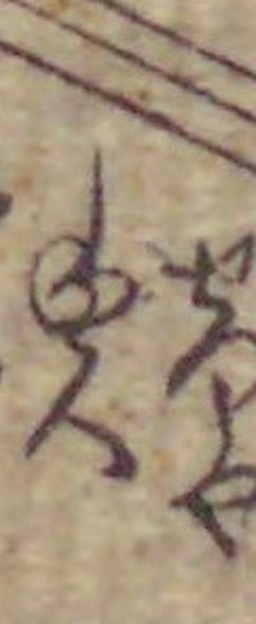しゆ人
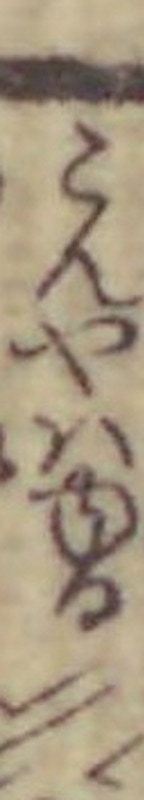こんやはゆる
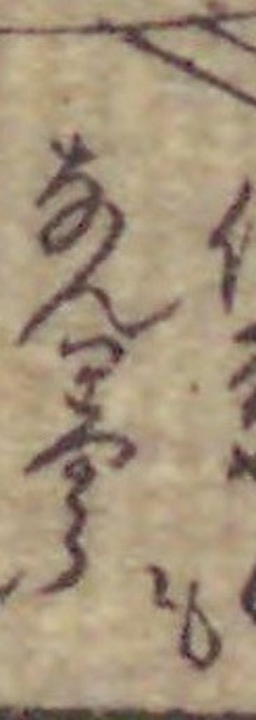なんりやう
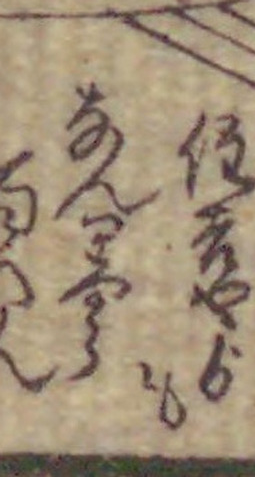なんりやう
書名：止而道致虚録 3巻
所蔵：国立国会図書館 National Diet Library, JAPAN
